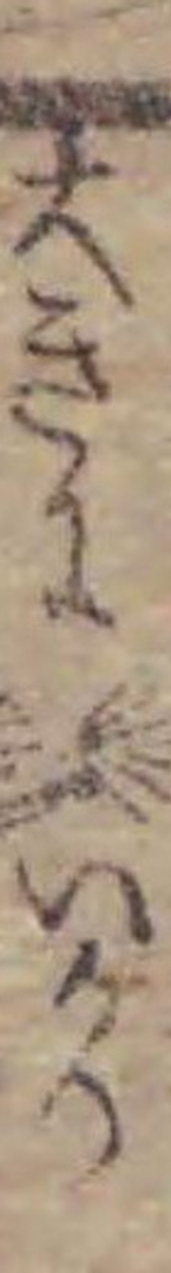大きにいかり
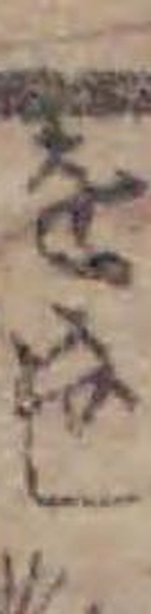をなし
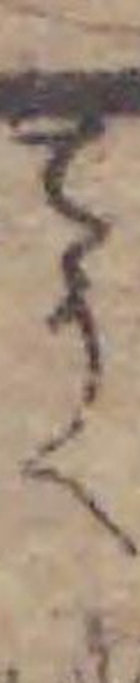てうへ
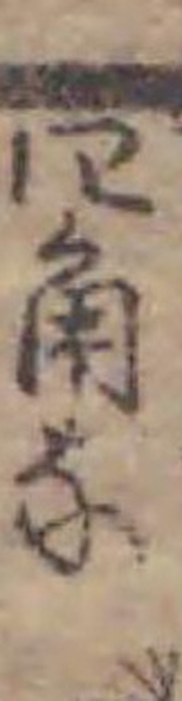四角な
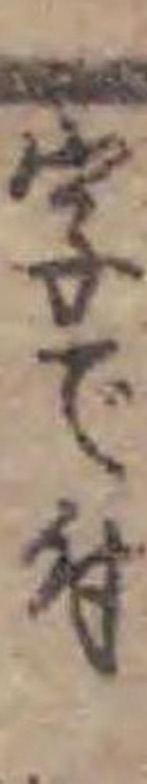字で付
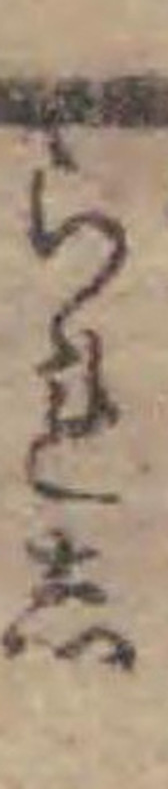られし
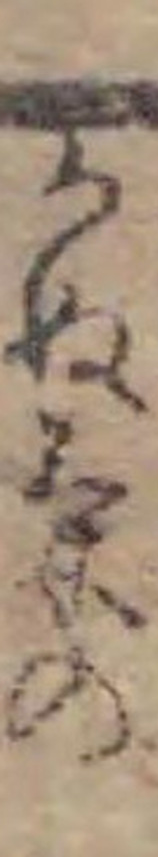かぬ気の
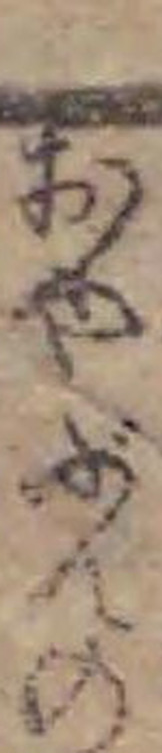おやぶんの
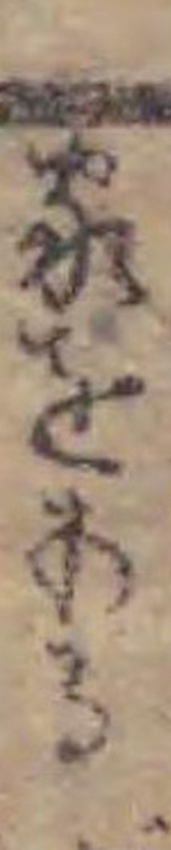家をある
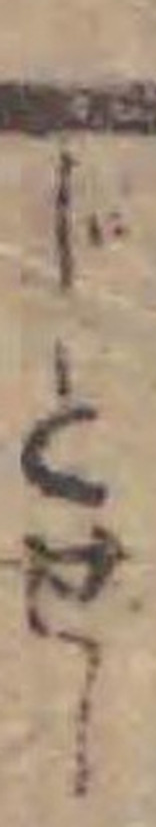じとせし
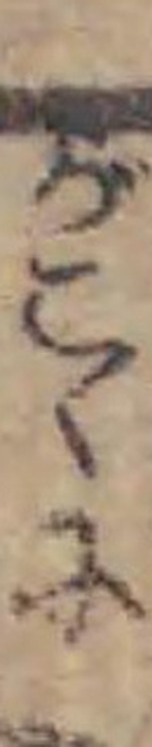がこゝに
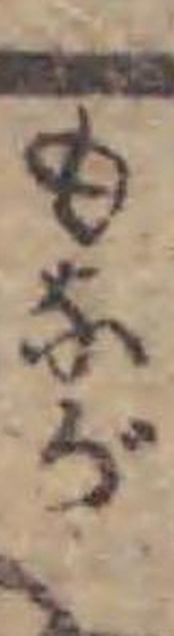もなが
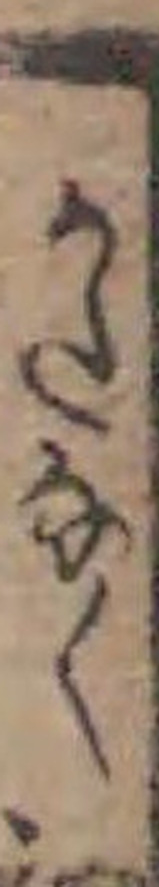かたなく
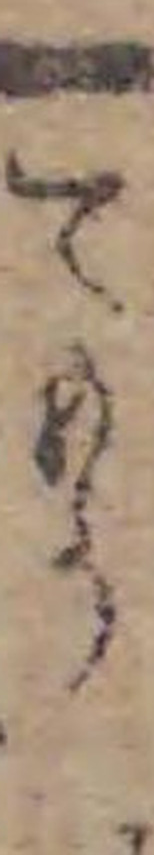てもう
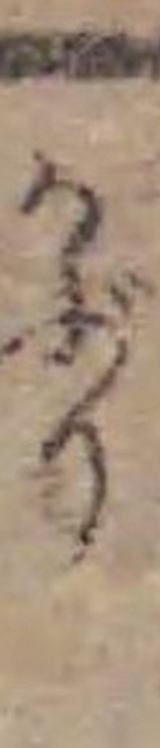かぶり
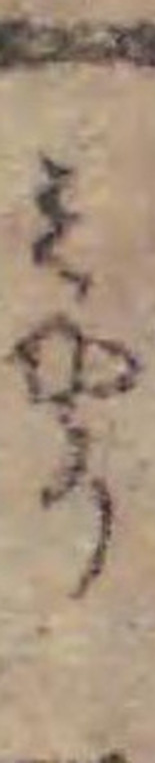みやう
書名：此奴和日本 : 2巻
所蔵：国立国会図書館 National Diet Library, JAPAN
